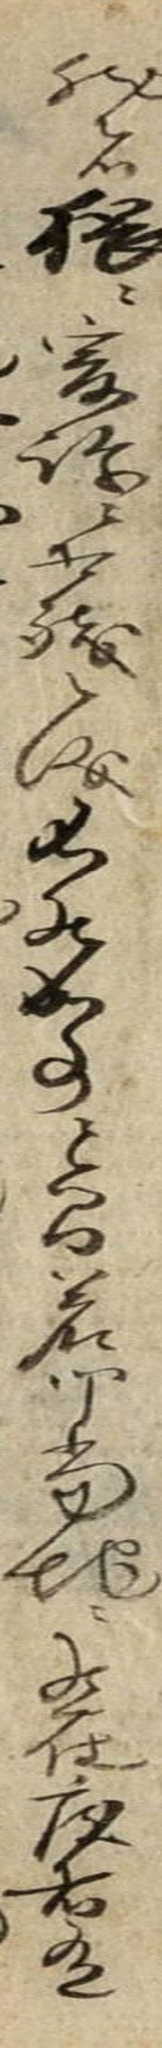然は猥に爰許に相残候儀不罷成事に候間若御当地に罷在度者有
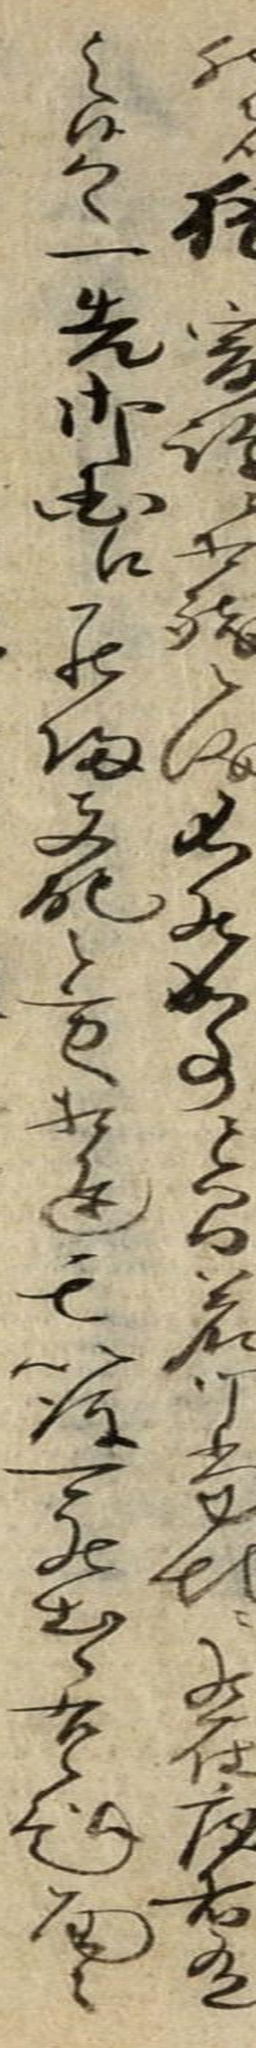之候はゝ一先御国江罷帰支配之方へ相達其以後可罷出候右之趣面々
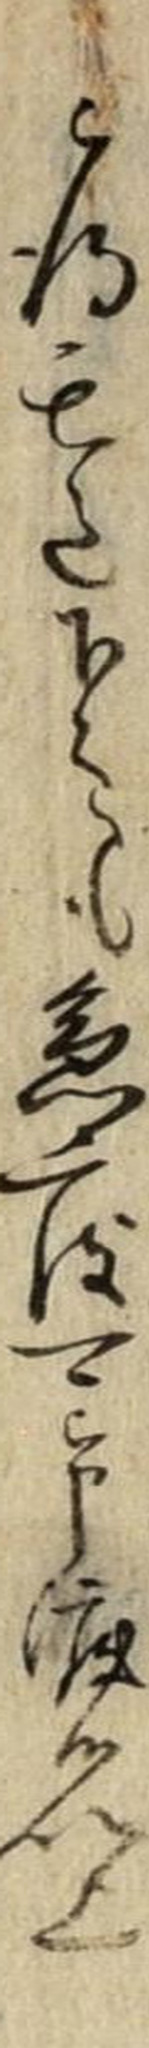被得其意下々へも急度可被申渡候以上
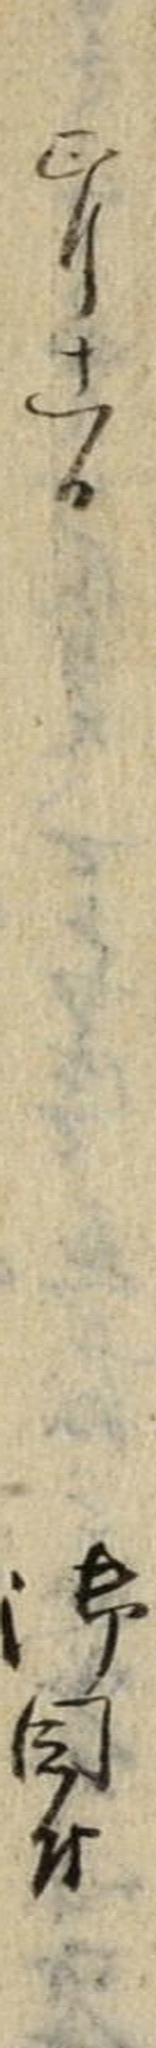正月十一日御目付
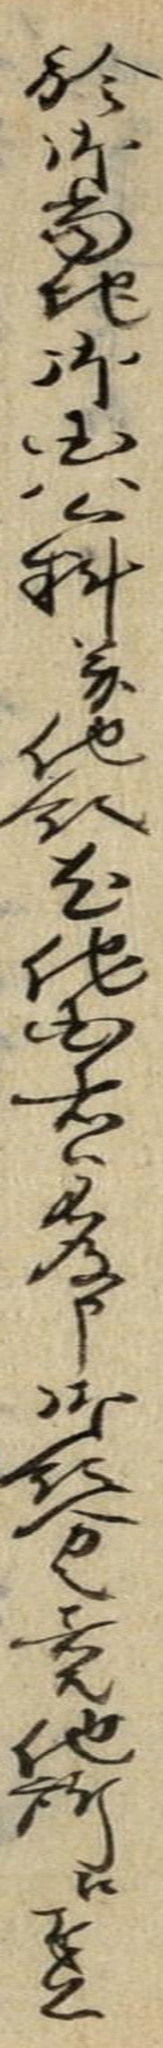於御当地御国公料并他領尤他国者は不及申御領分之者共他所へ奉公
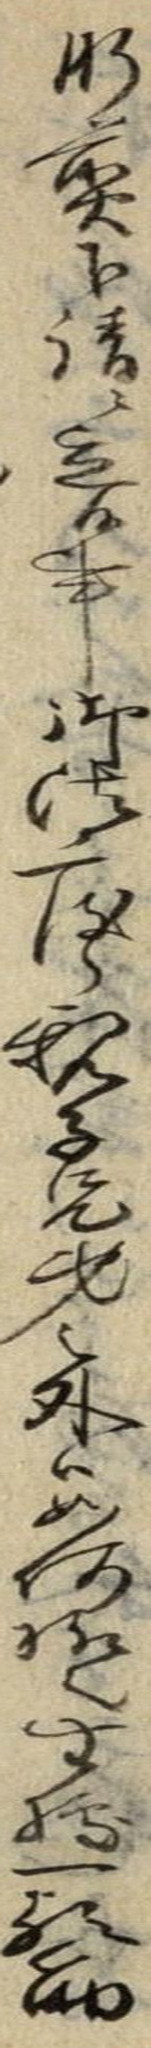肝煎下請に立候事御法度候親子兄弟之外は如何様之無據一類筋
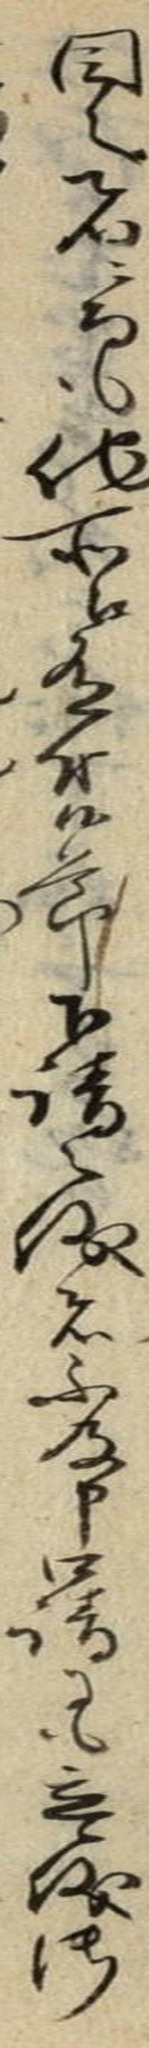目之者にても他所江有付候節下請之儀は不及申口請にも立候儀御
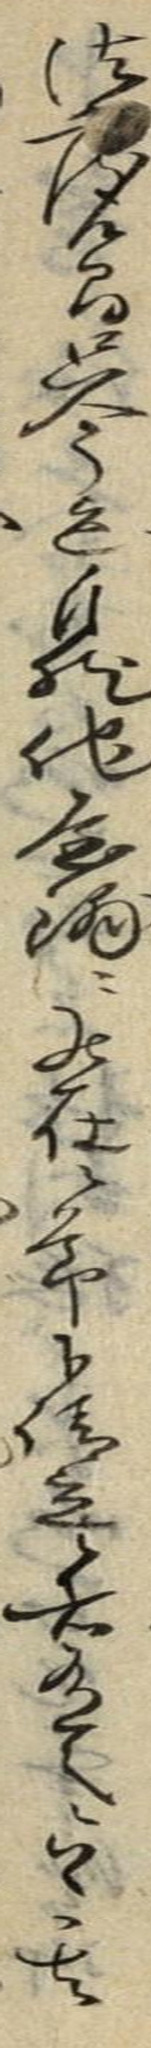法度候間只今迄自然他屋舗に罷在候節下請立候者有之候はゝ其
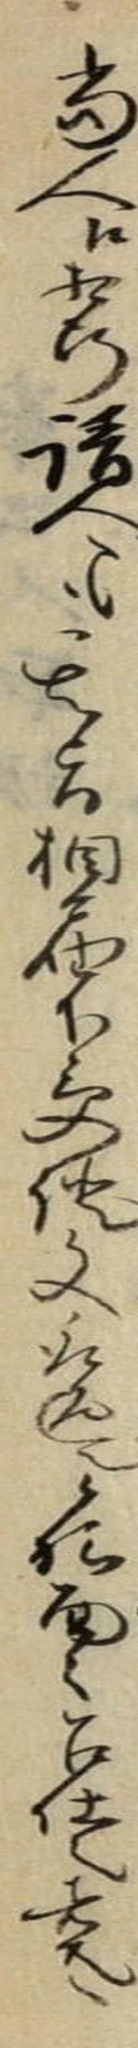当人江相断請人へも其旨相届下受證文取返し候様面々召仕之者共へ
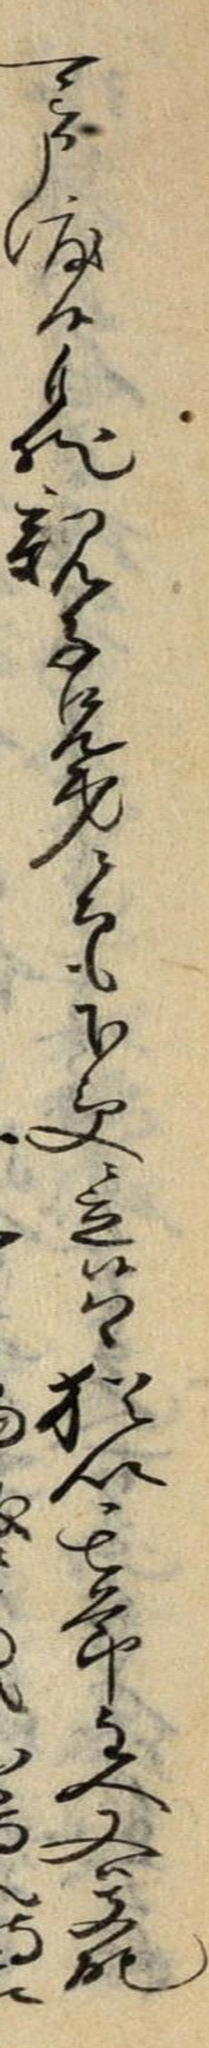可被申渡候自然親子兄弟にても下受に立候はゝ猶以其節主人又は支配
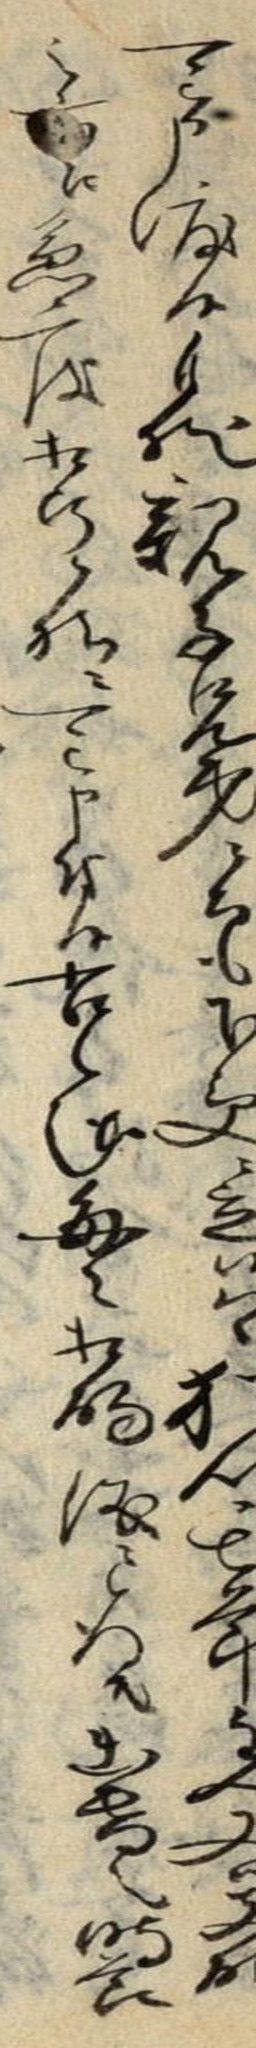之者江急度相断候様に可被申付候右之趣毎々相触儀に候得共出替之時節
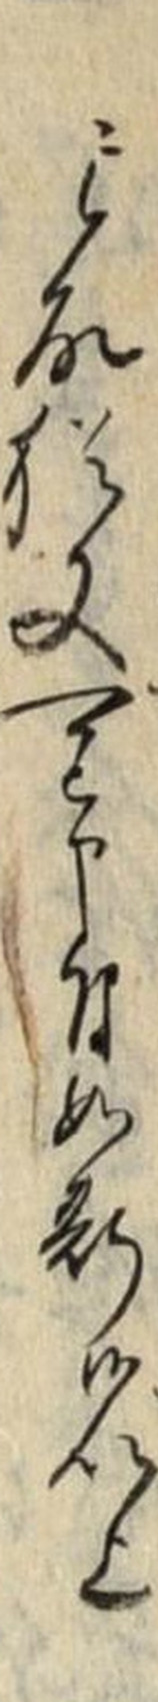に候故猶又可被申付如斯候以上
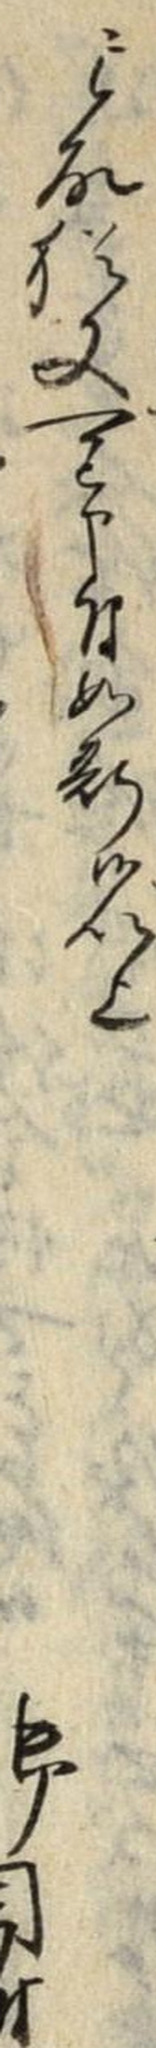に候故猶又可被申付如斯候以上
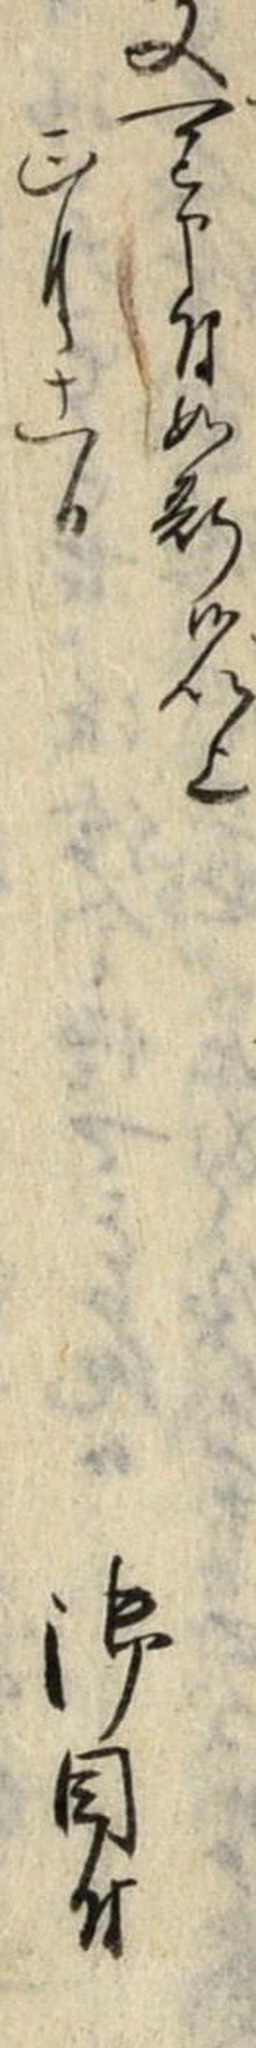正月十一日御目付
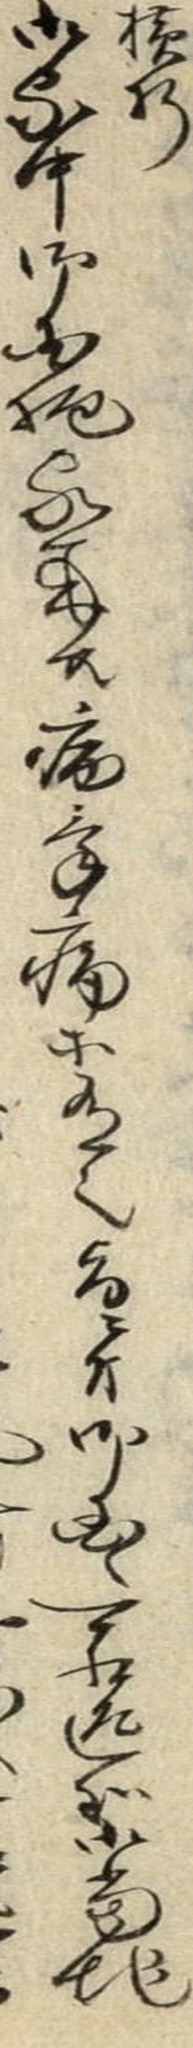御家中御国抱家来共病気痛等有之旨に付御国へ可相返処御当地
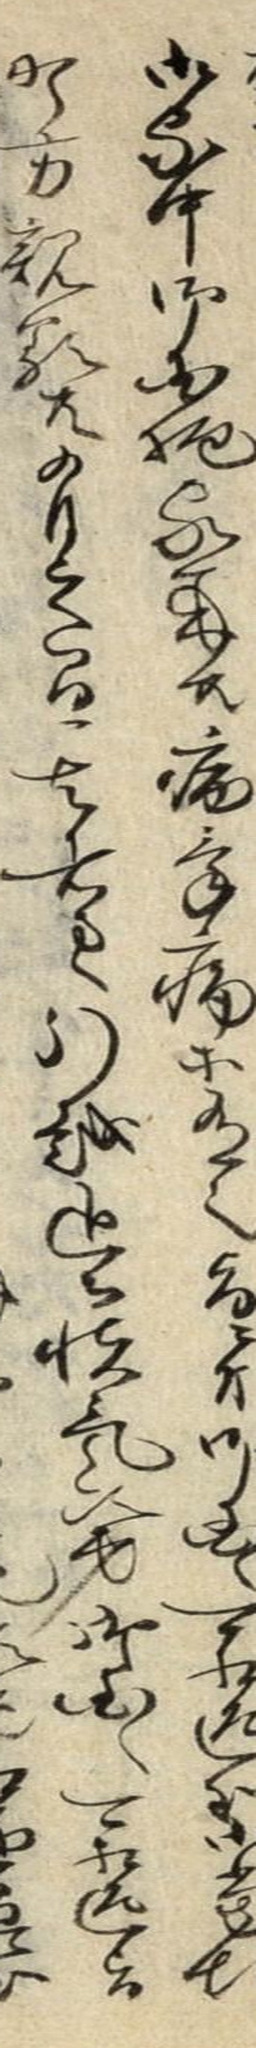町方親類共有之間其者方へ引越追て快気次第御国へ可相返旨
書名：三都并道中之部
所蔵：福井県文書館 Fukui Prefectural Archives
